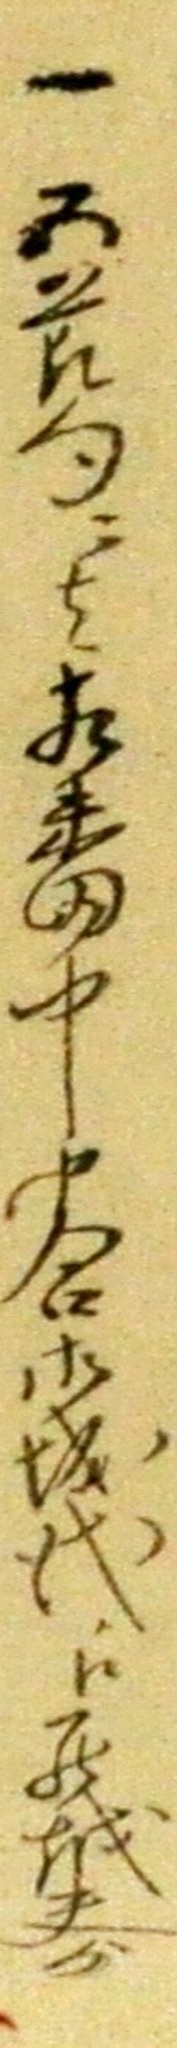一五節句には相番中申合御城代え罷越夫ゟ
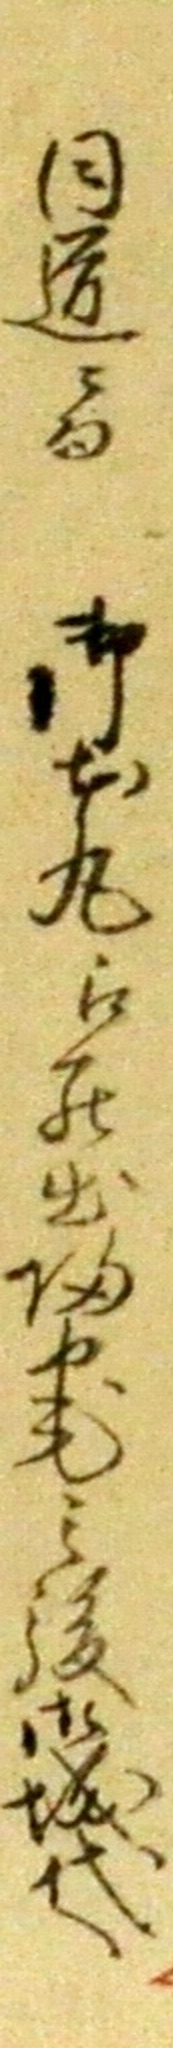同道に而御本丸え罷出帰宅之後御城代ヘ
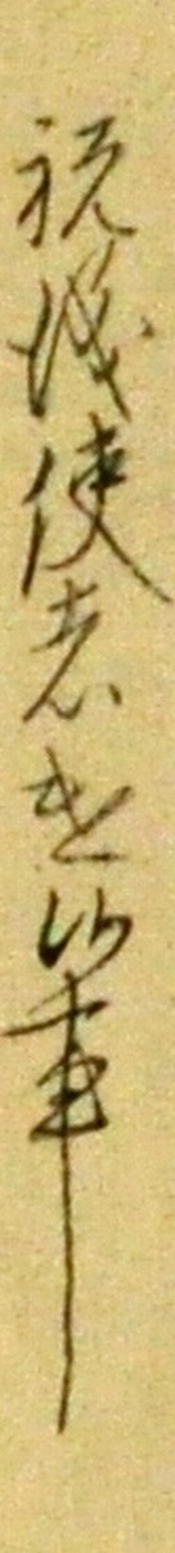祝儀使者遣候事
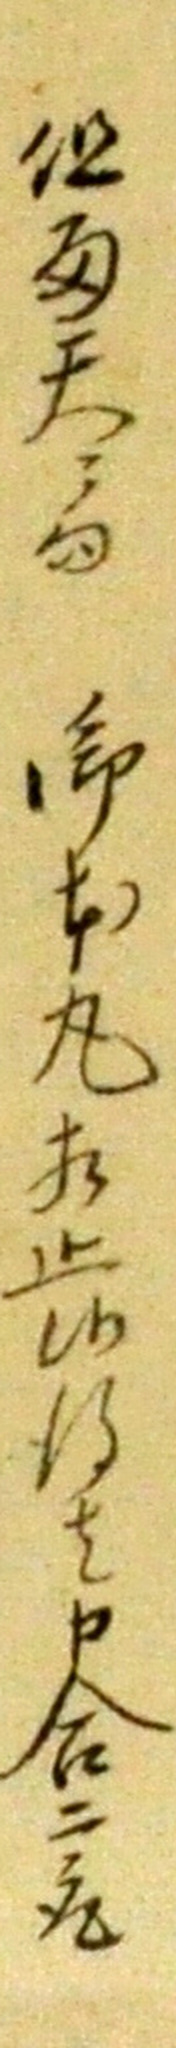但雨天に而御本丸相止候得は申合最
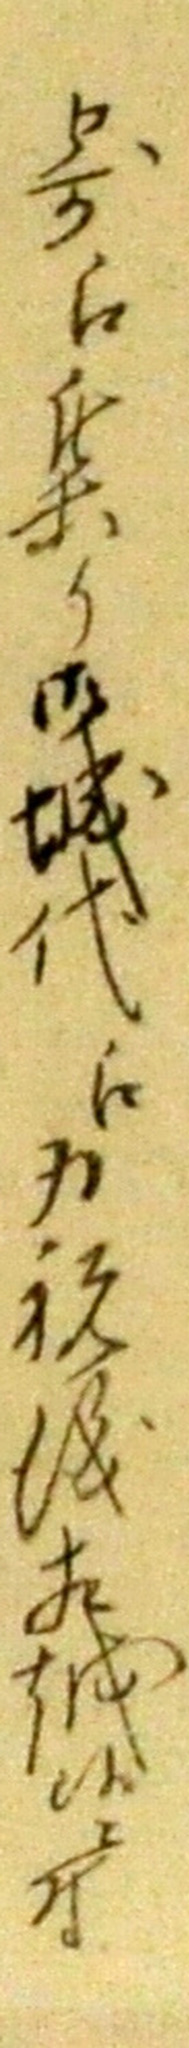寄え集り御城代え為祝儀相越候に付
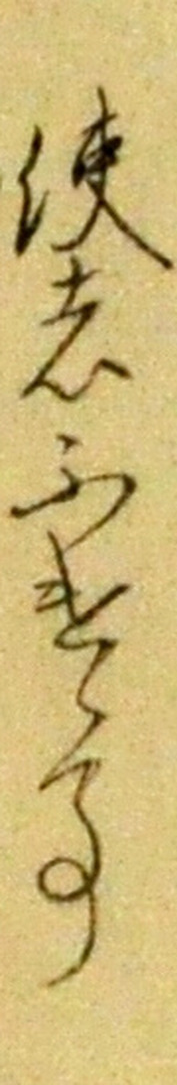使者不遣候事
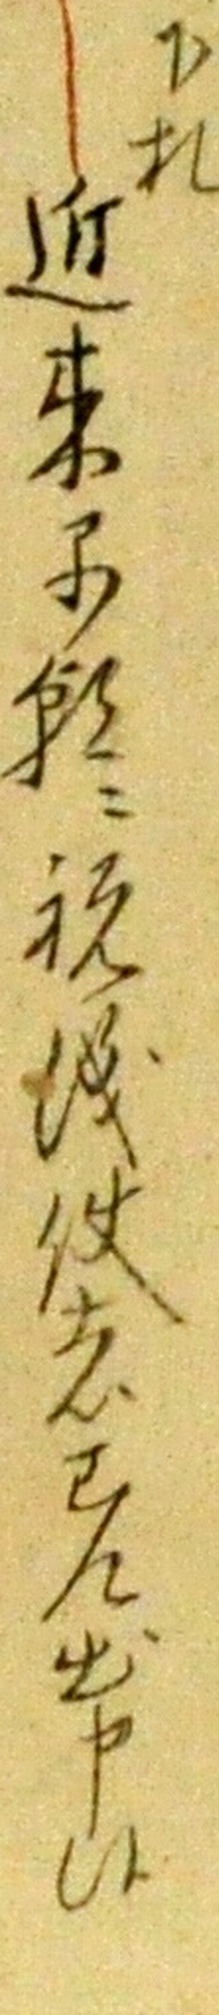下札近来早朝に祝儀使者差出申候
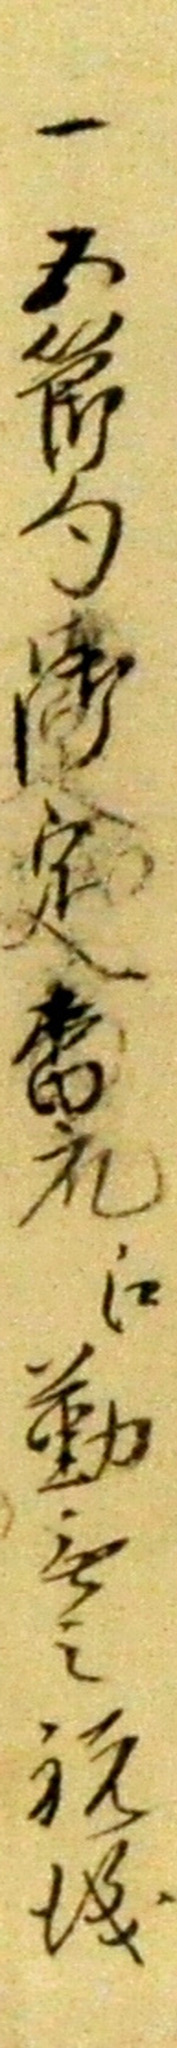一五節句御定番衆え勤無之祝儀
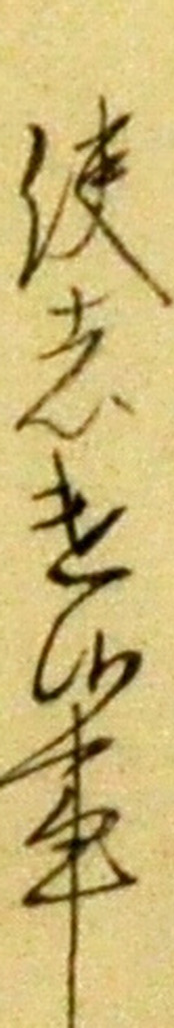使者遣候事
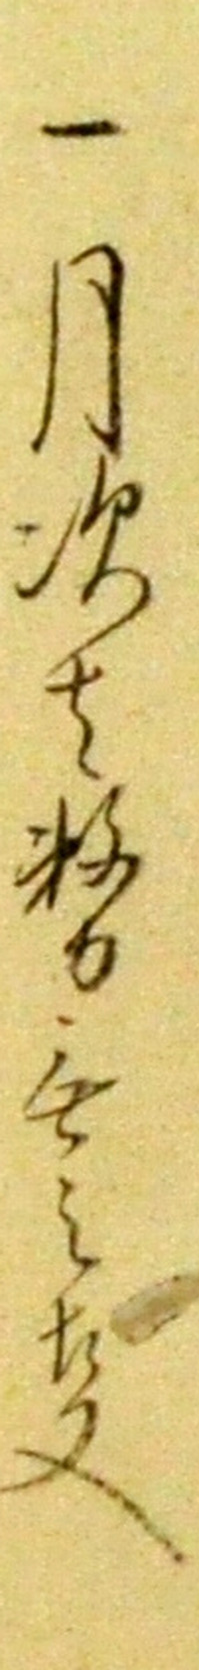一月次は務無之事
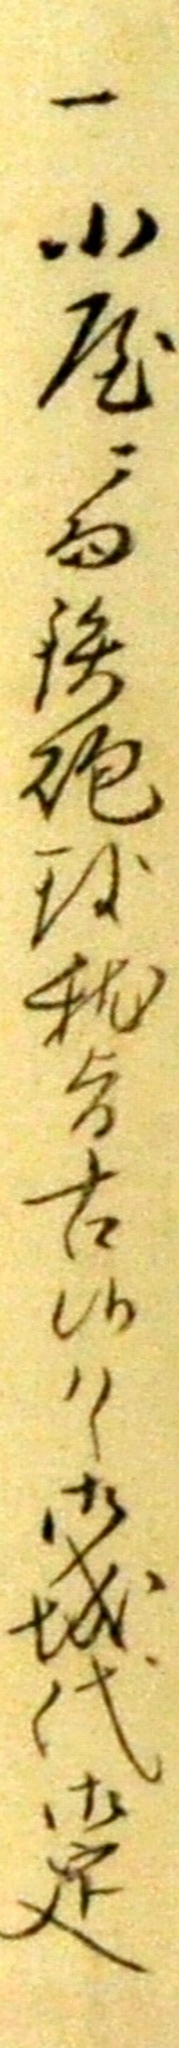一小屋に而鉄砲致稽古候ハヽ御城代御定

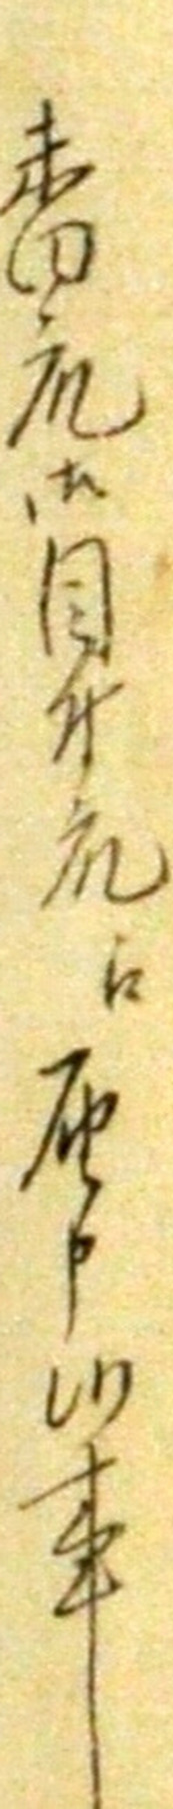番衆御目付衆え届申候事
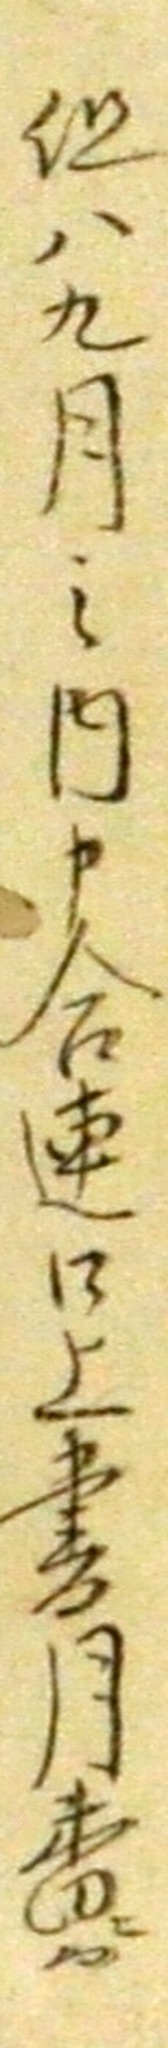但八九月之内申合連口上書月番に而
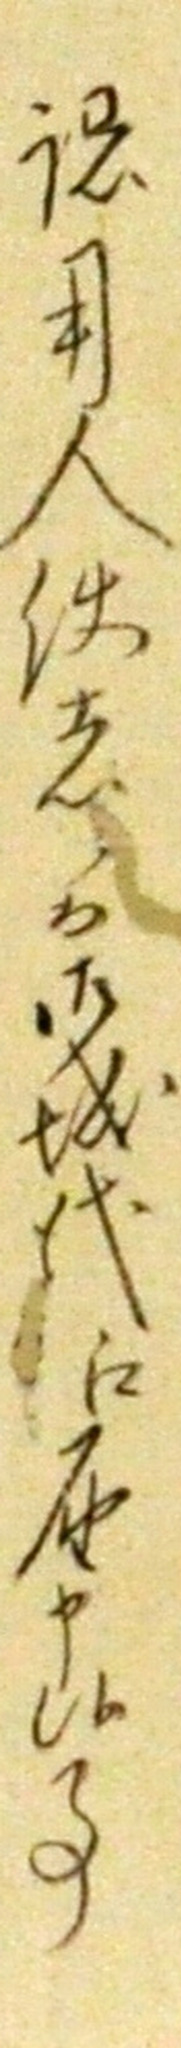認用人使者ゟ御城代え届申候事
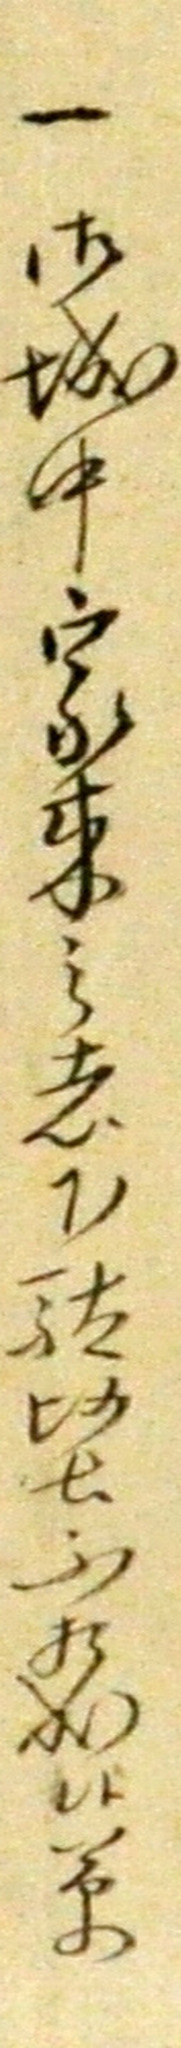一御城中家来之者下駄堅不相成候草
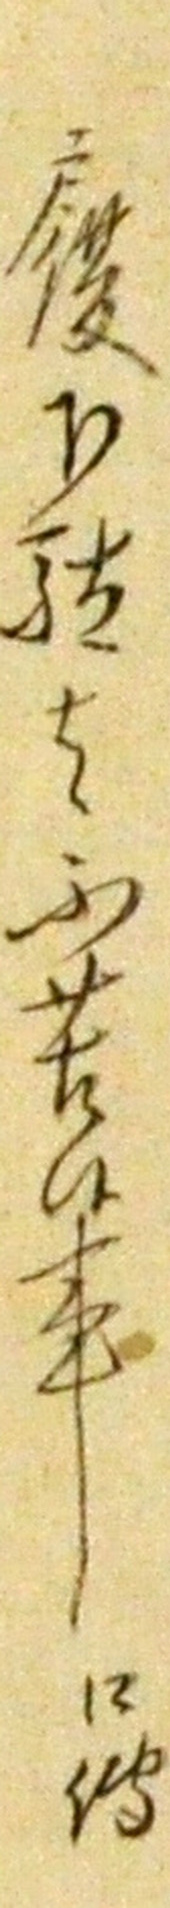履下駄は不苦候事口伝
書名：大阪加番関係諸書留〔一括〕
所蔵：伊那市立高遠町図書館・合同会社AMANE
